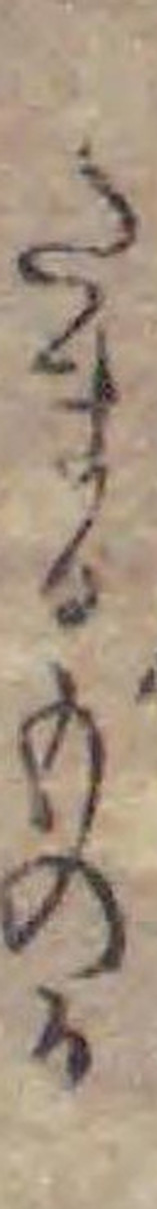たまるものか
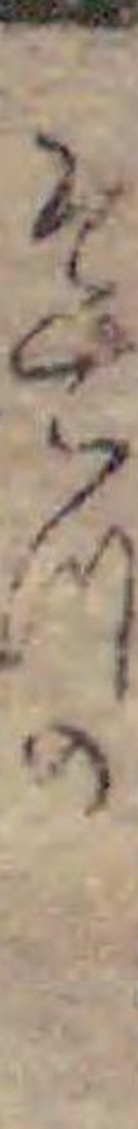そてつの

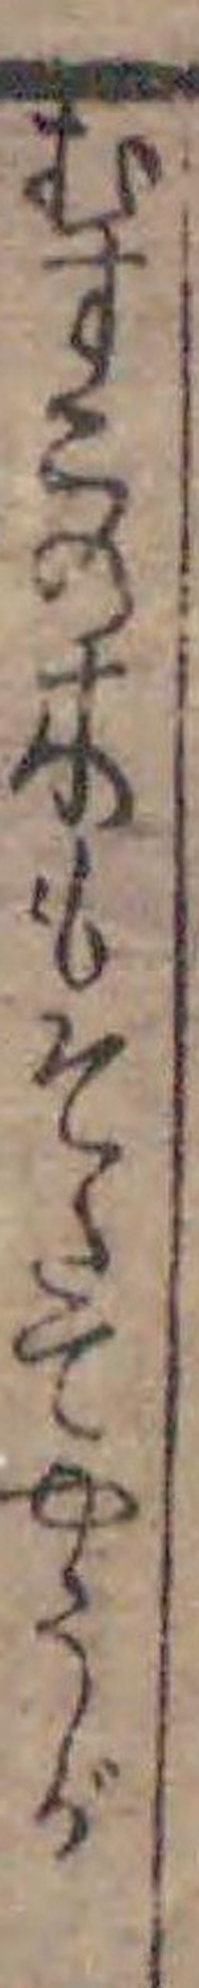むすこの木もそたてやうが
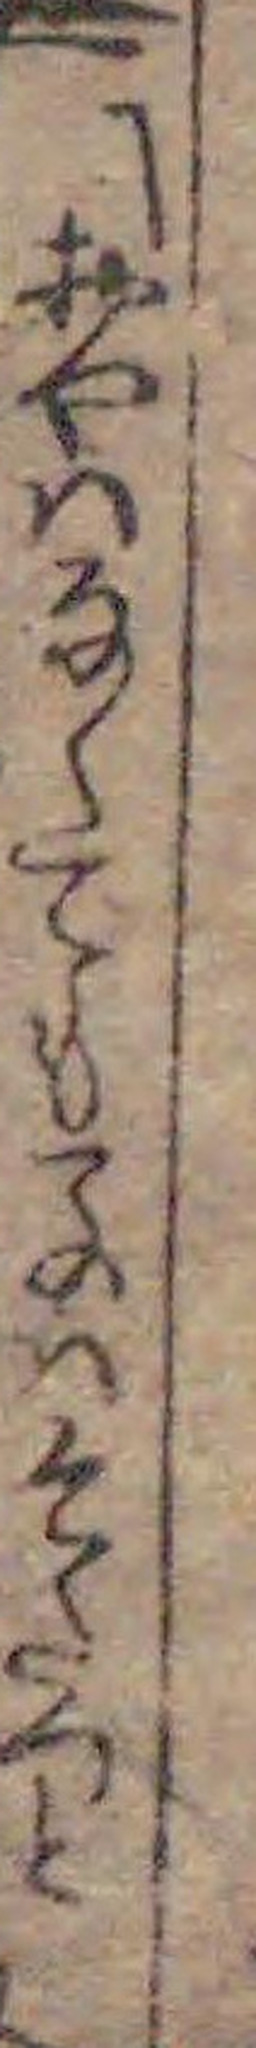〽おやはなくても子はそたつと
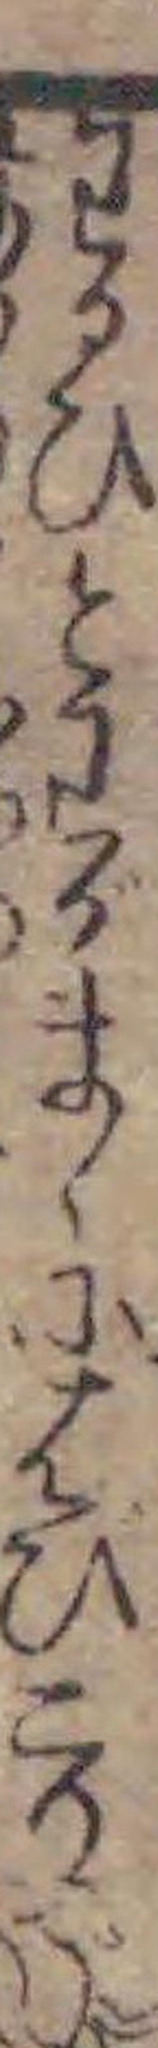わるひとわがまゝにはびこり
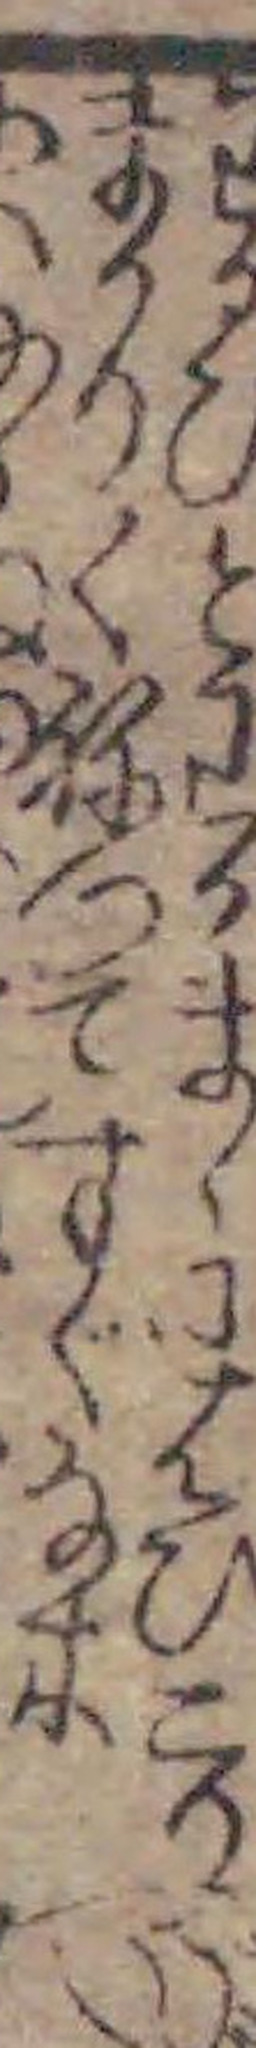まかりくねつてすぐな木
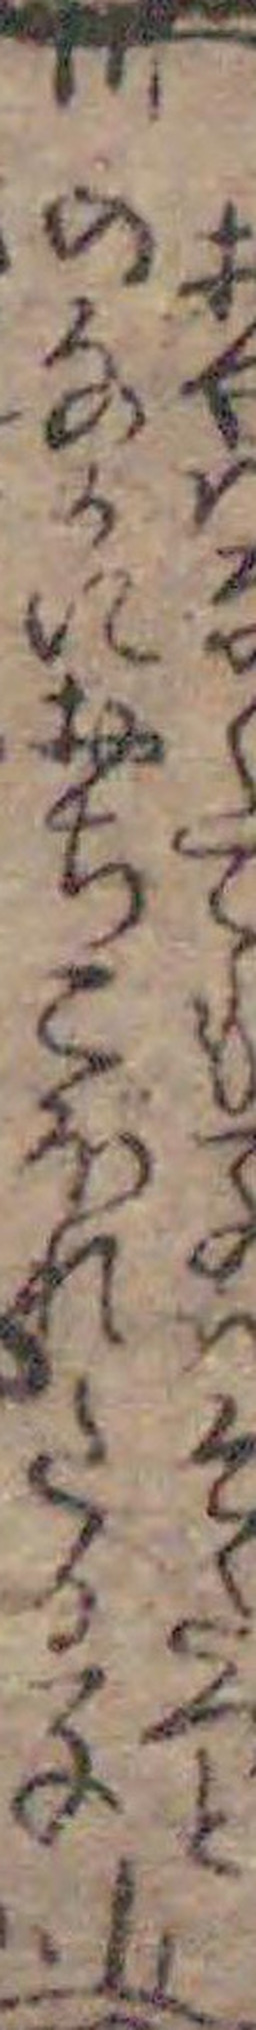のなかにおちこぼれたる子
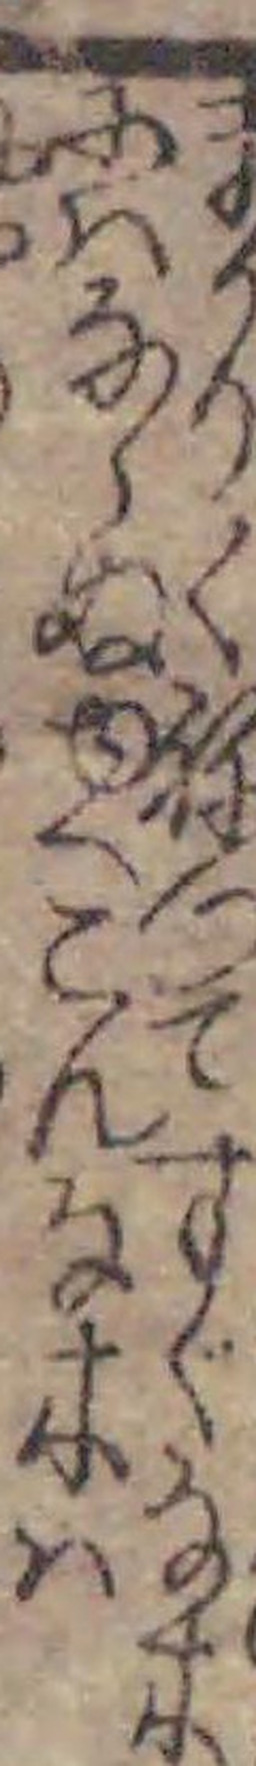にはならぬゆへこんな木は
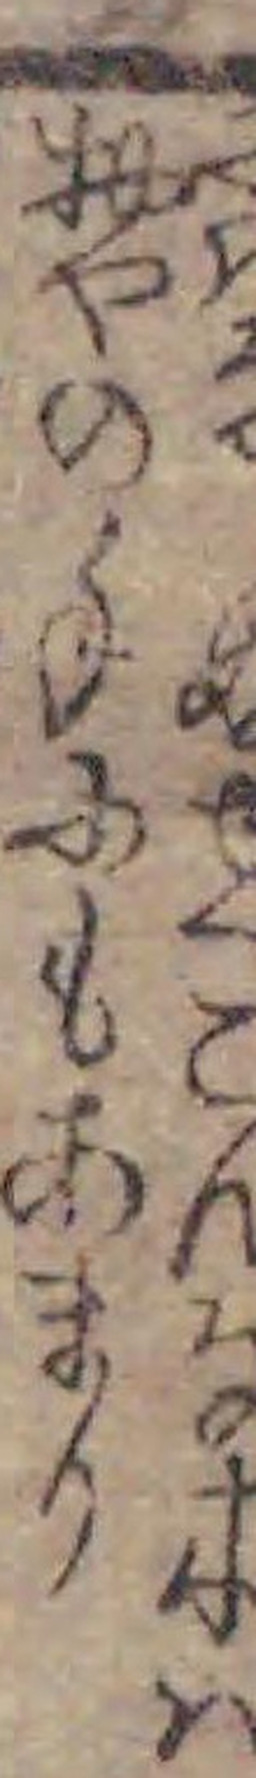おやの手にもあまり
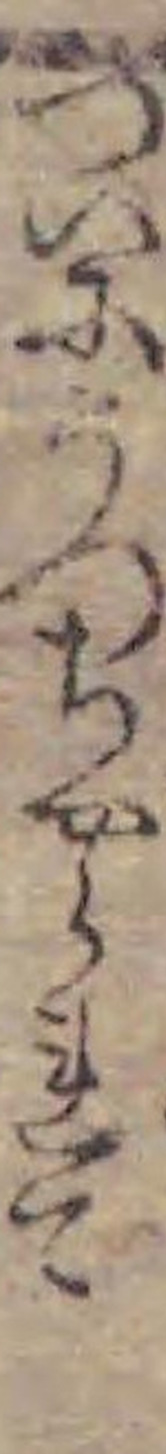ついにうつちやられて
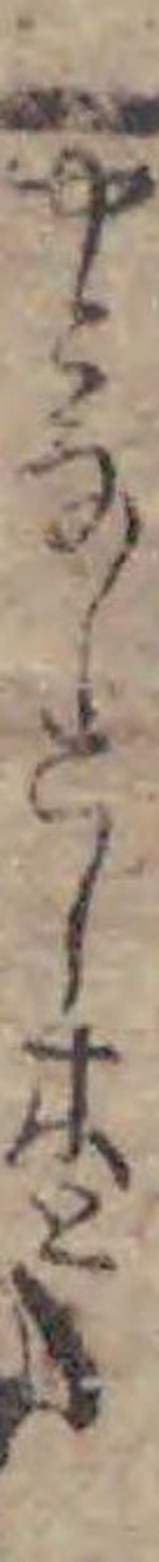やとなしこし木と
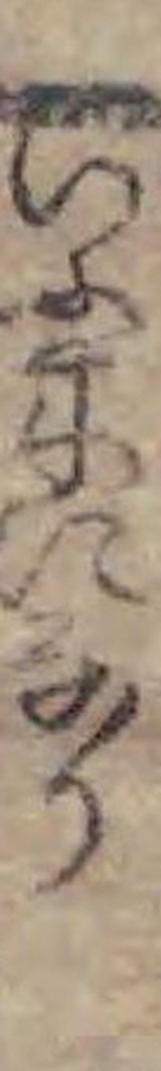いふ木になり
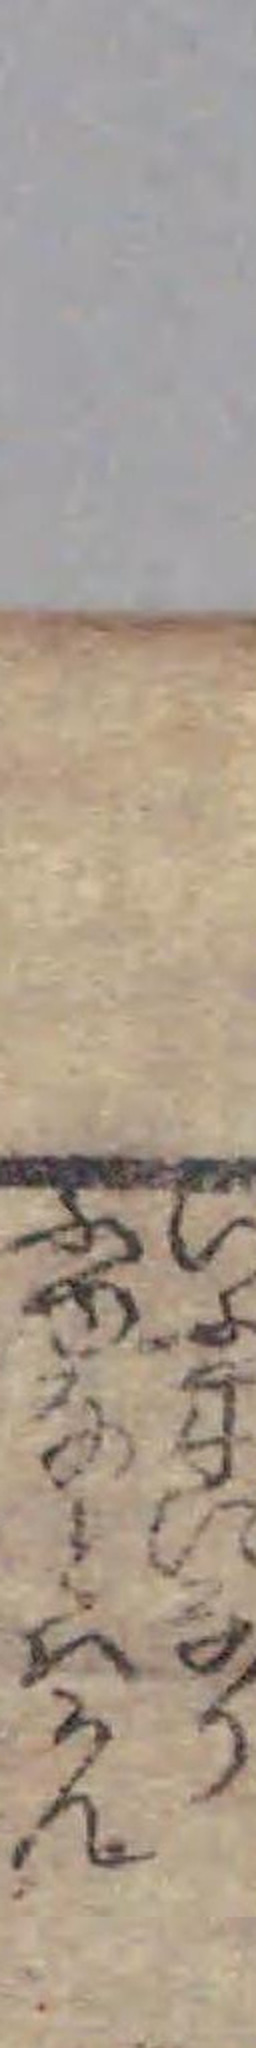ふゆなとはかん
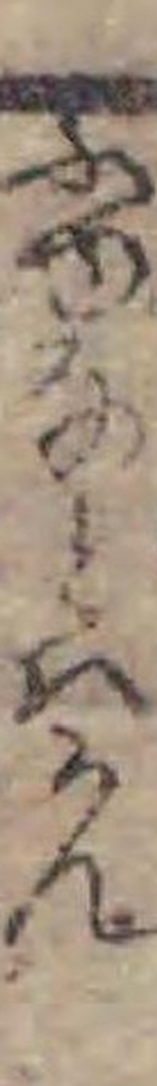ふゆなとはかん
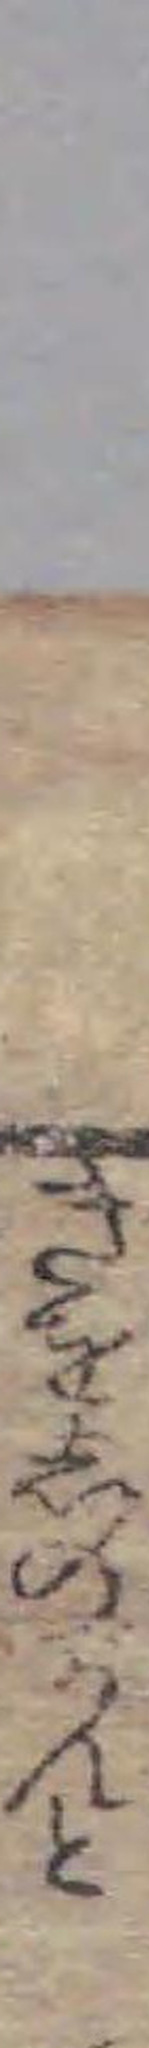きをしのがんと
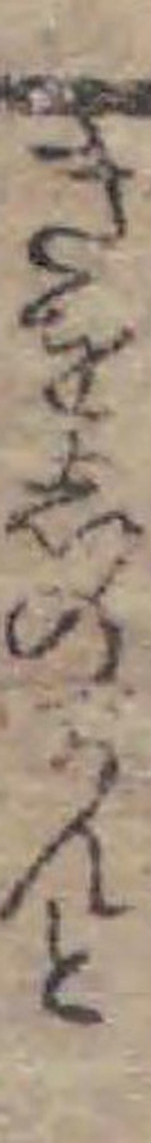きをしのがんと
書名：奇妙頂礼胎錫杖 : 3巻
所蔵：国立国会図書館 National Diet Library, JAPAN
